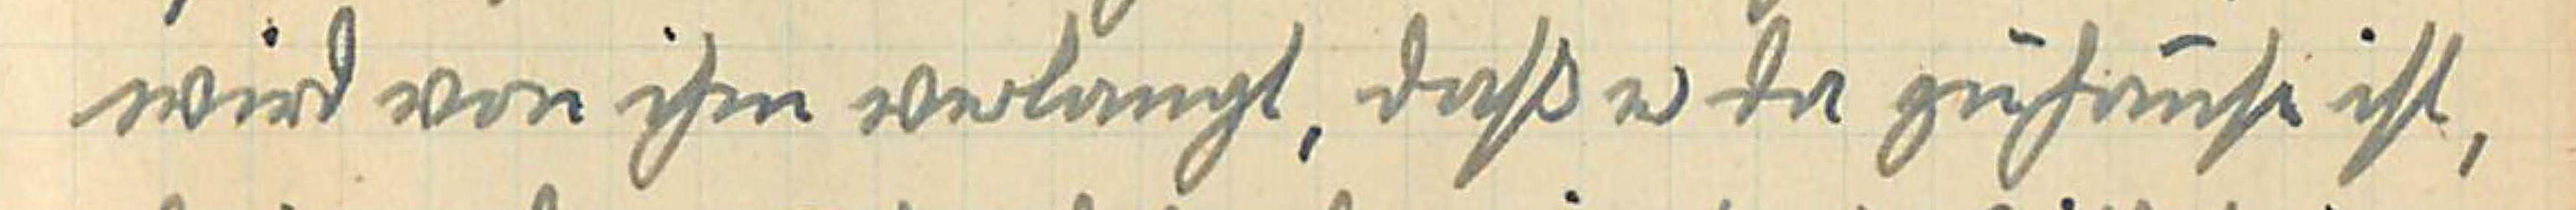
wird von ihm verlangt, daß er da zuhause ist,
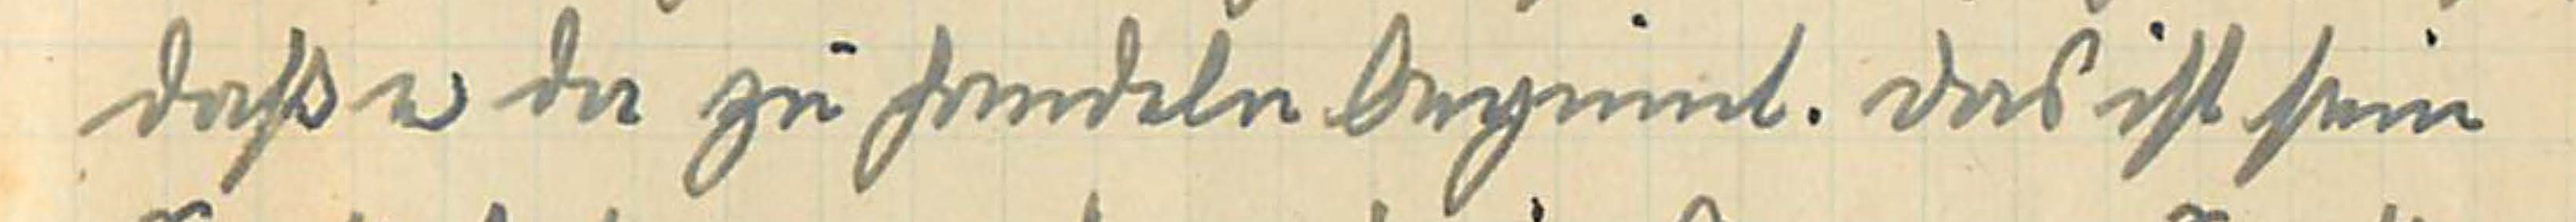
daß er da zu handeln beginnt. Das ist sein
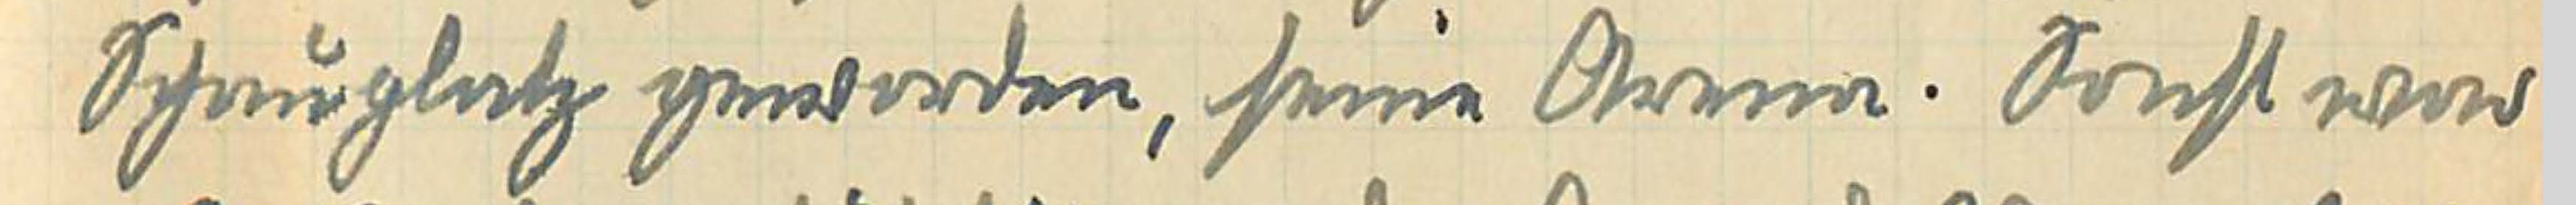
Schauplatz geworden, seine Arena. Sonst war
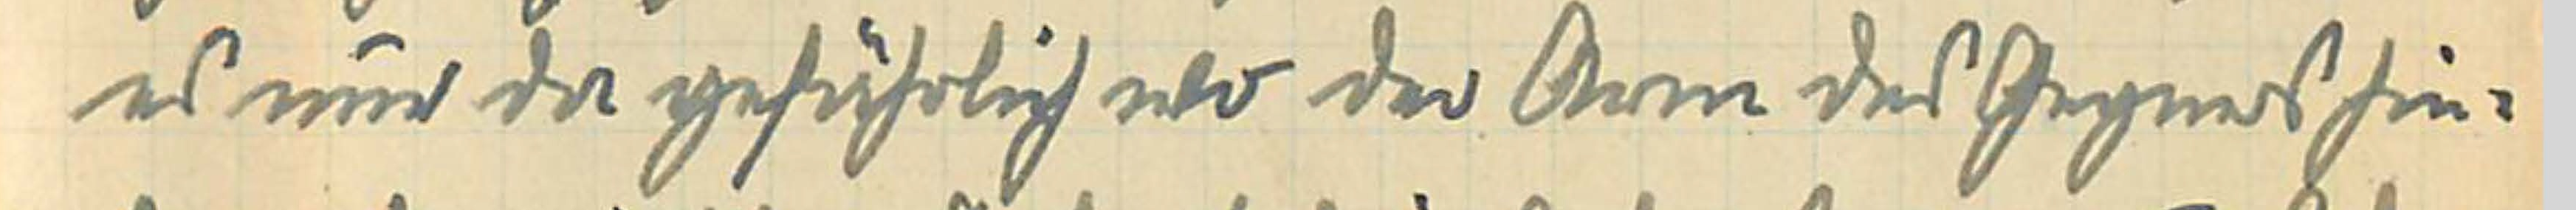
es nur da gefährlich wo der Arm des Gegners hin-
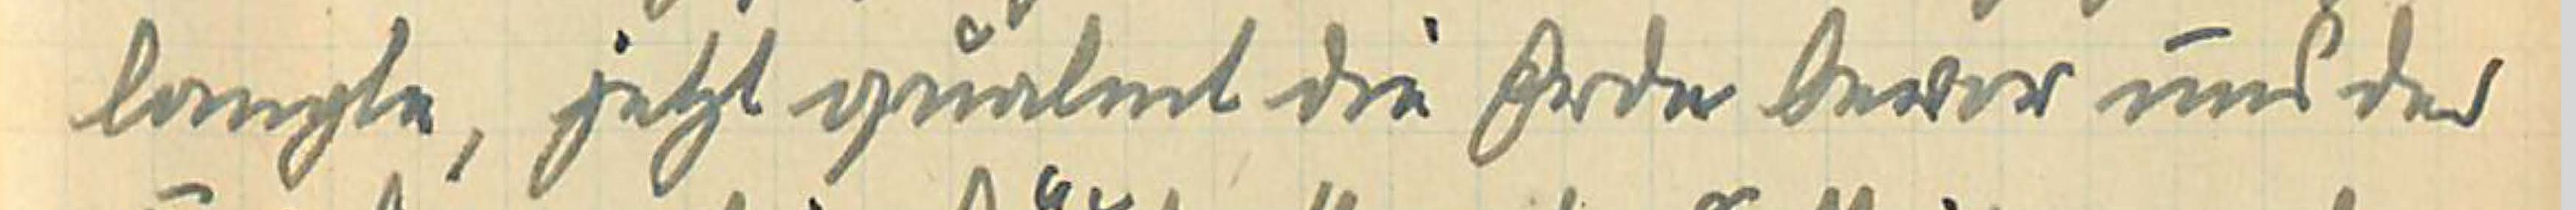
langte, jetzt qualmt die Erde bevor uns der
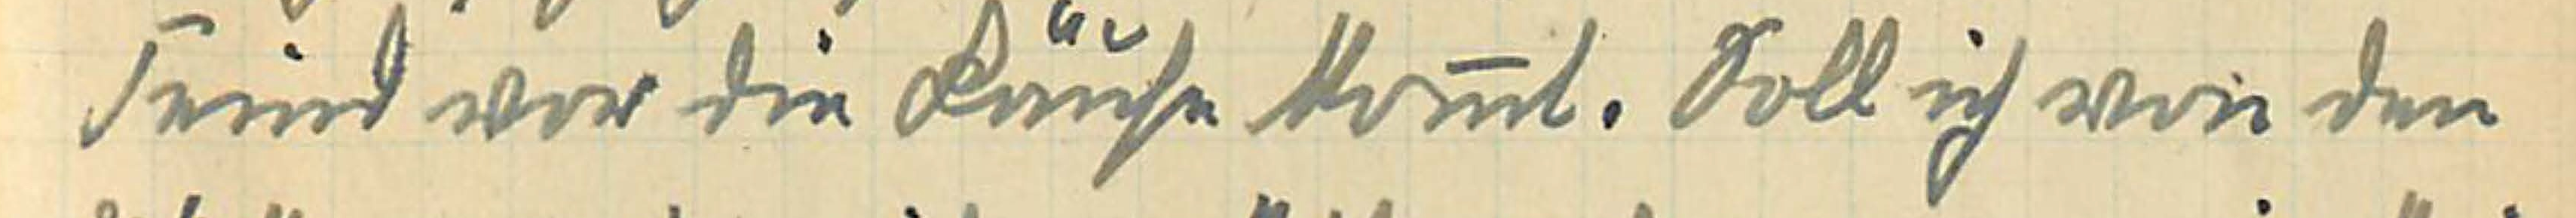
Feind vor die Läufe kommt. Soll ich von den
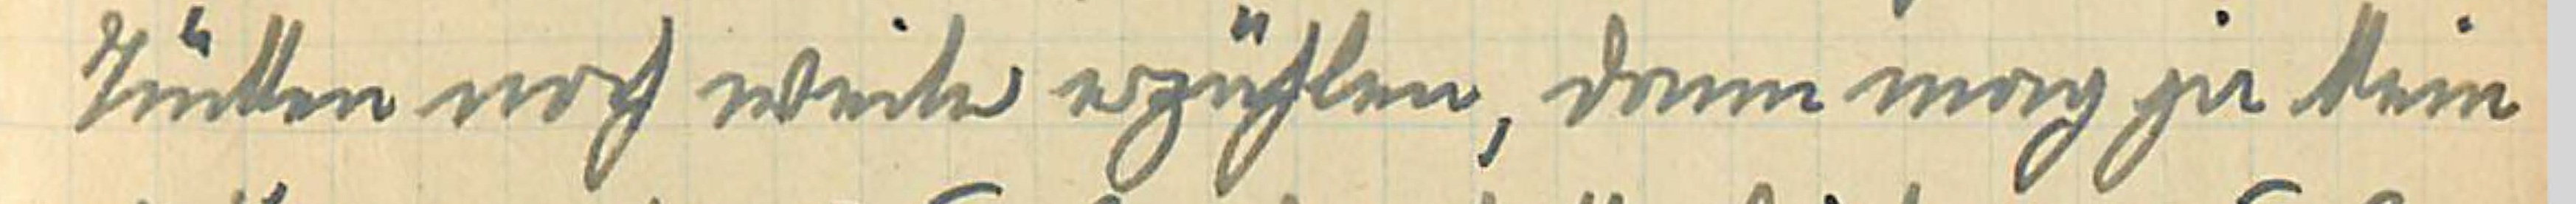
Tücken noch weiter erzählen, dann mag ja kein
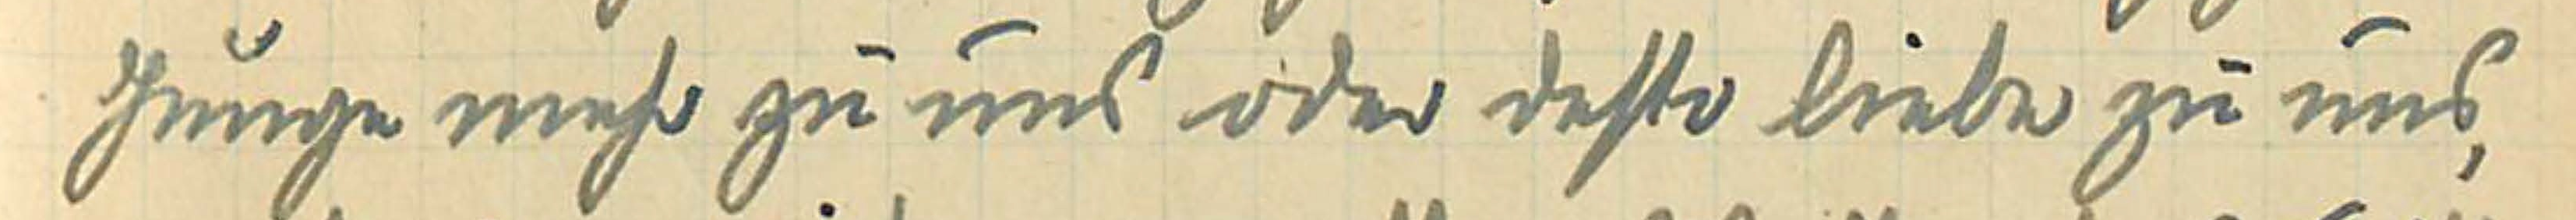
Junge mehr zu uns oder desto lieber zu uns,
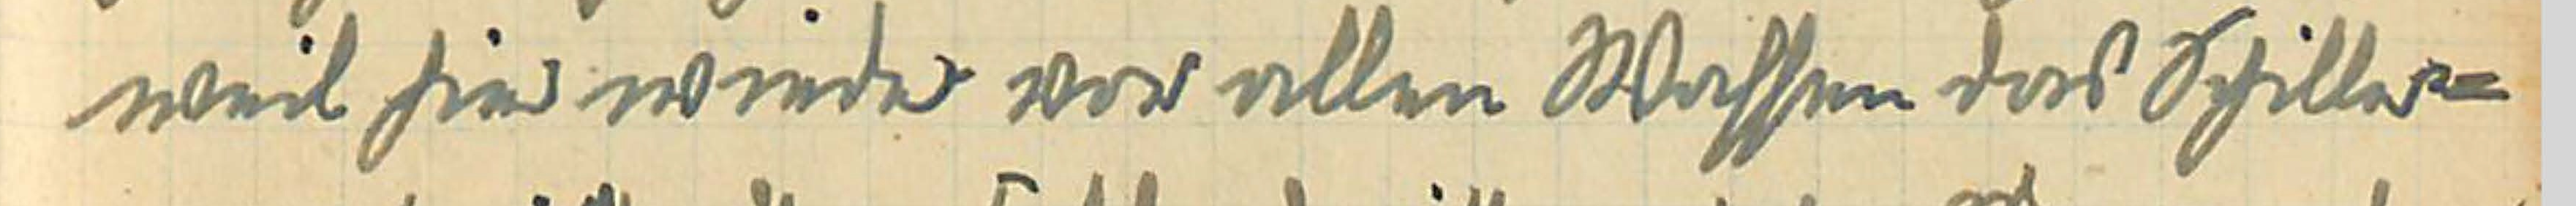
weil hier wieder vor allen Waffen das Schiller-
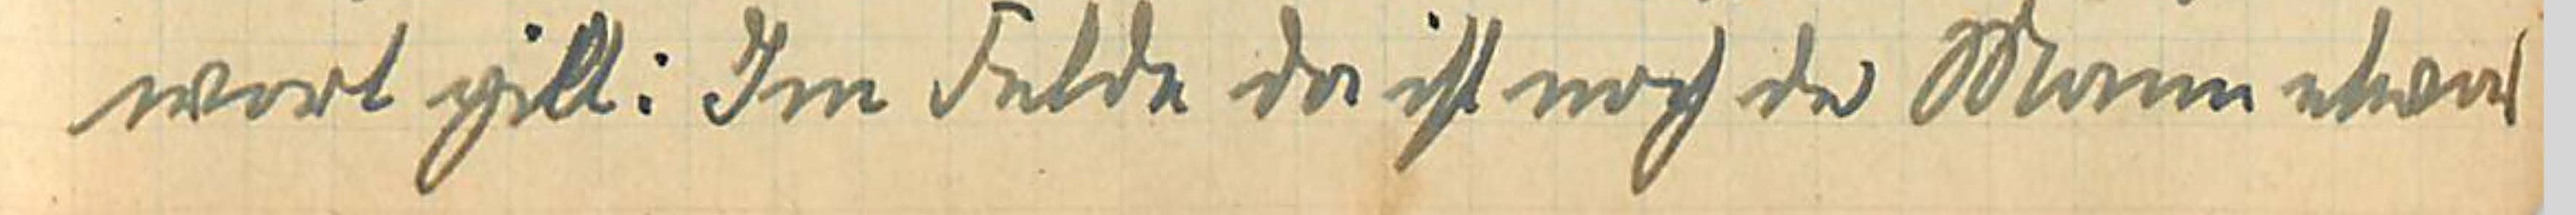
wort gilt: Im Felde da ist noch der Mann etwas
